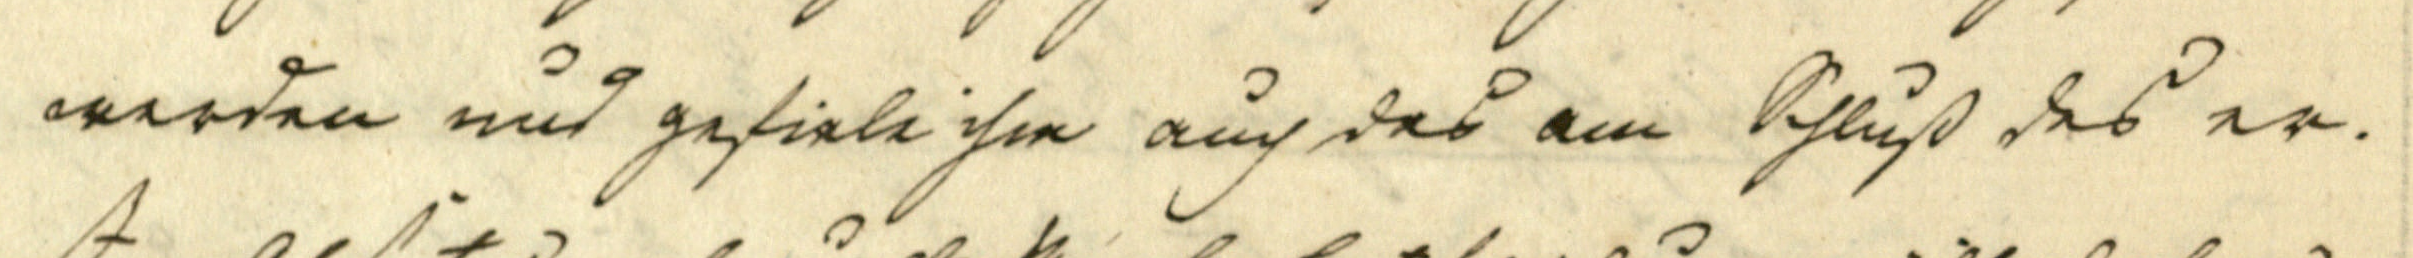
werden und gefiele ihm auch das am Schluß des er¬
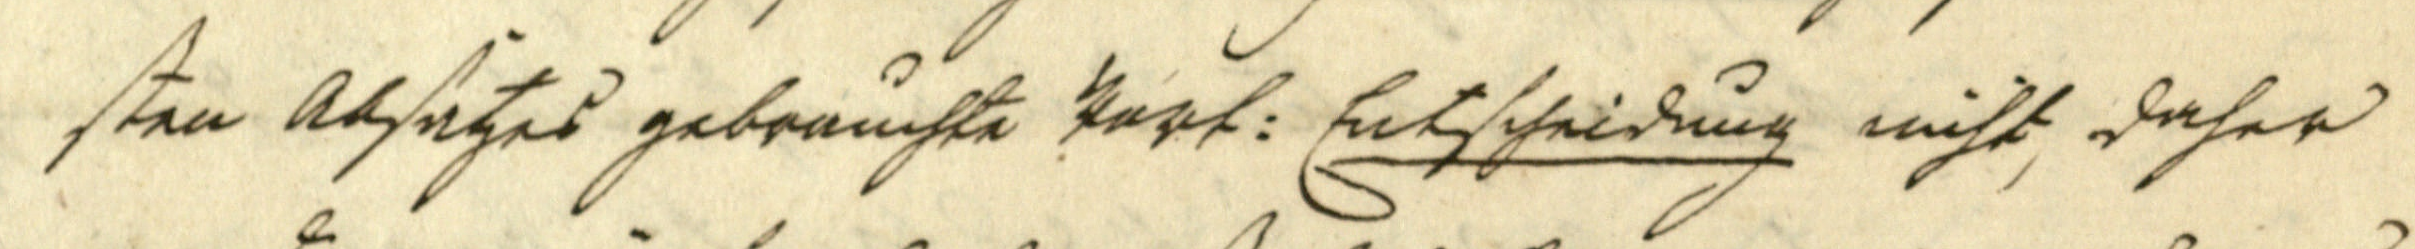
sten Absatzes gebrauchte Wort: Entscheidung nicht, daher
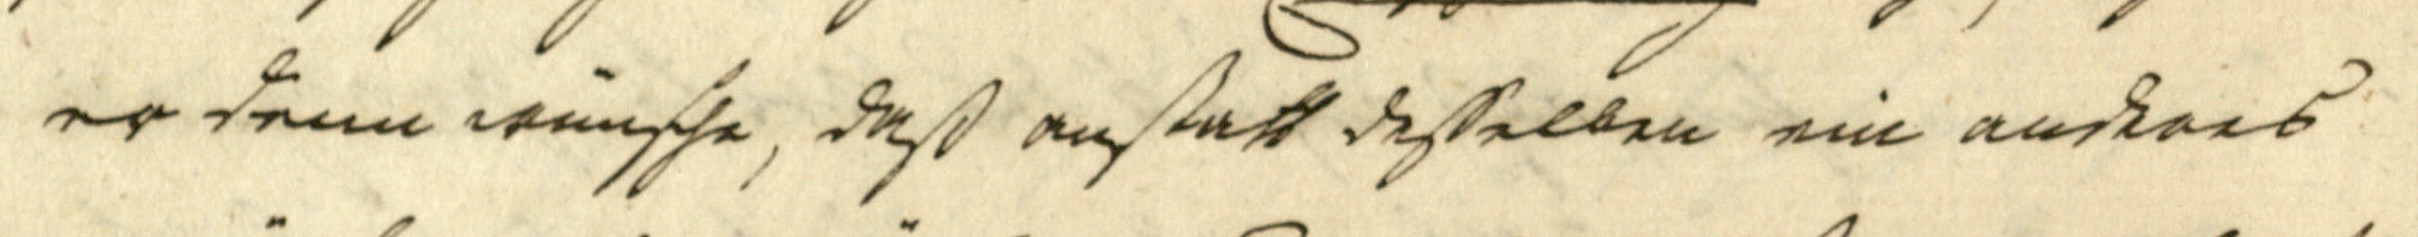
er denn wünsche, daß anstatt desselben ein anderes
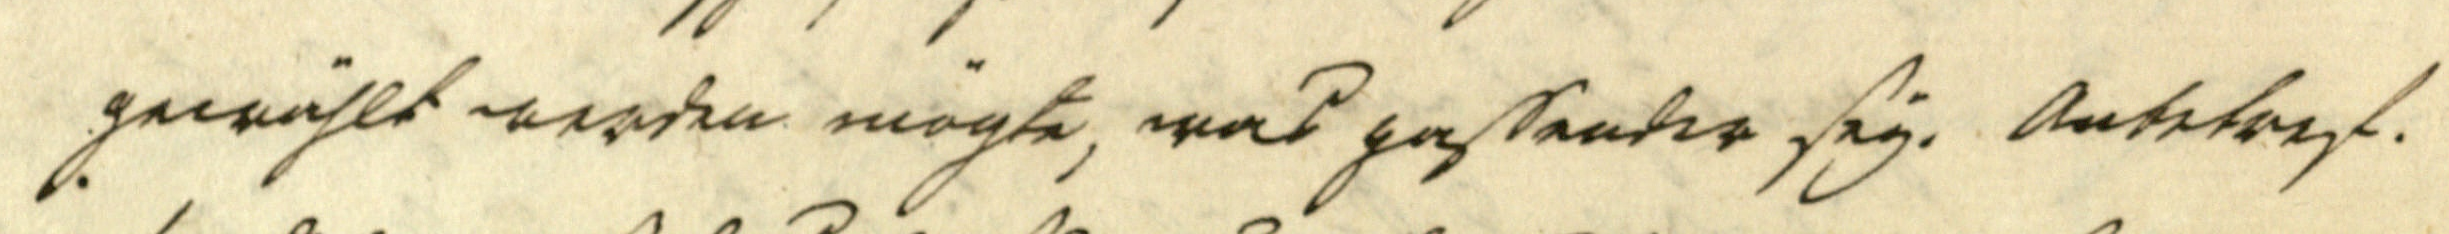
gewählt werden mögte, was passender seÿ. Anbetref¬
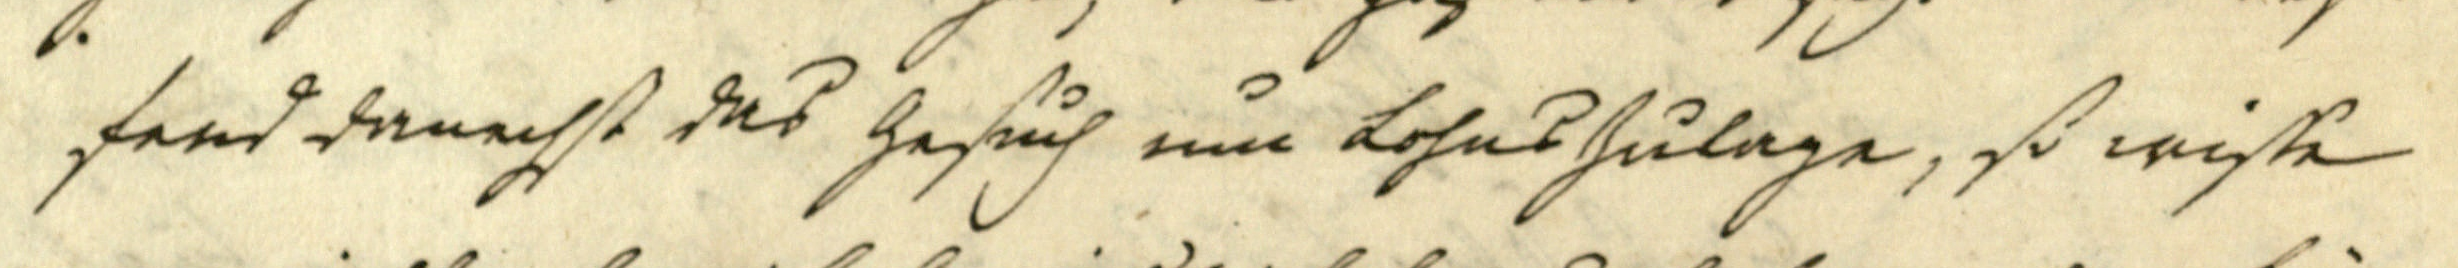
fand danechst das Gesuch um Lohns Zulage, so wisse
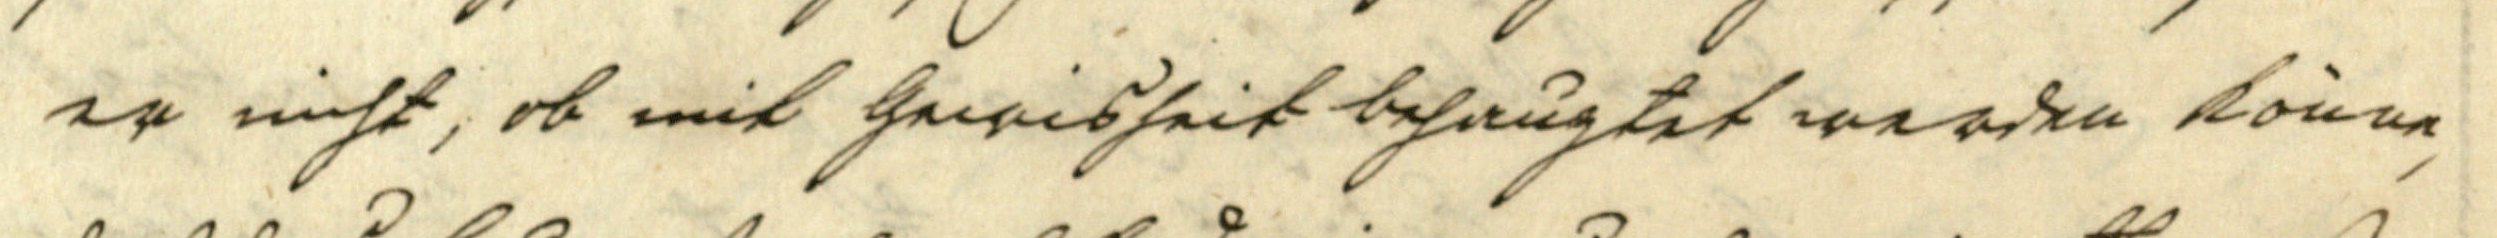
er nicht, ob mit Gewisheit behauptet werden könne,
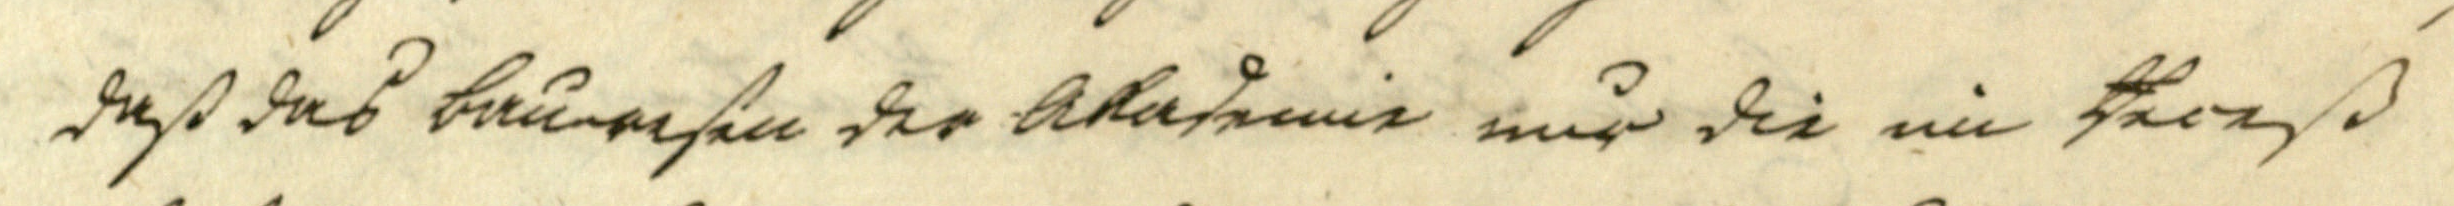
daß das Bauwesen der Akademie nur die im Receß
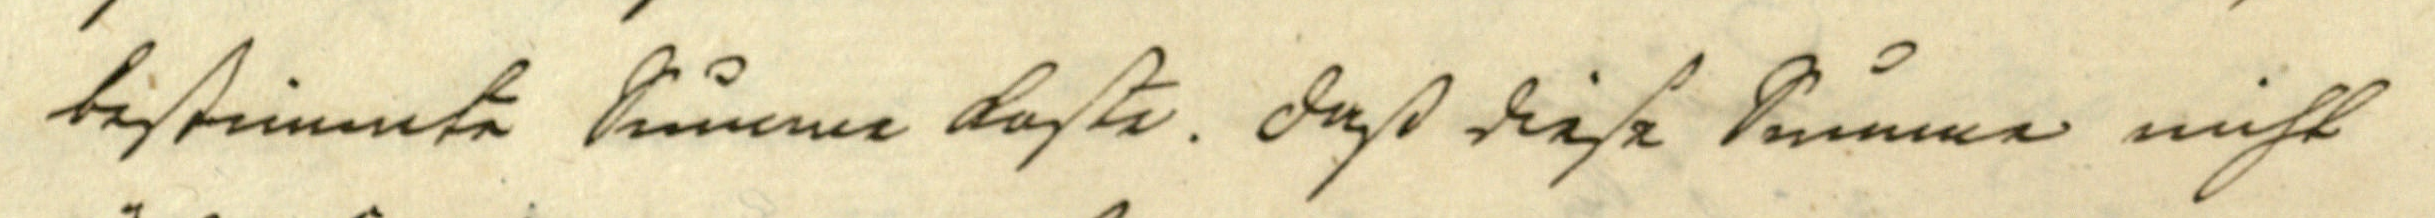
bestimmte Summe koste. Daß diese Summe nicht
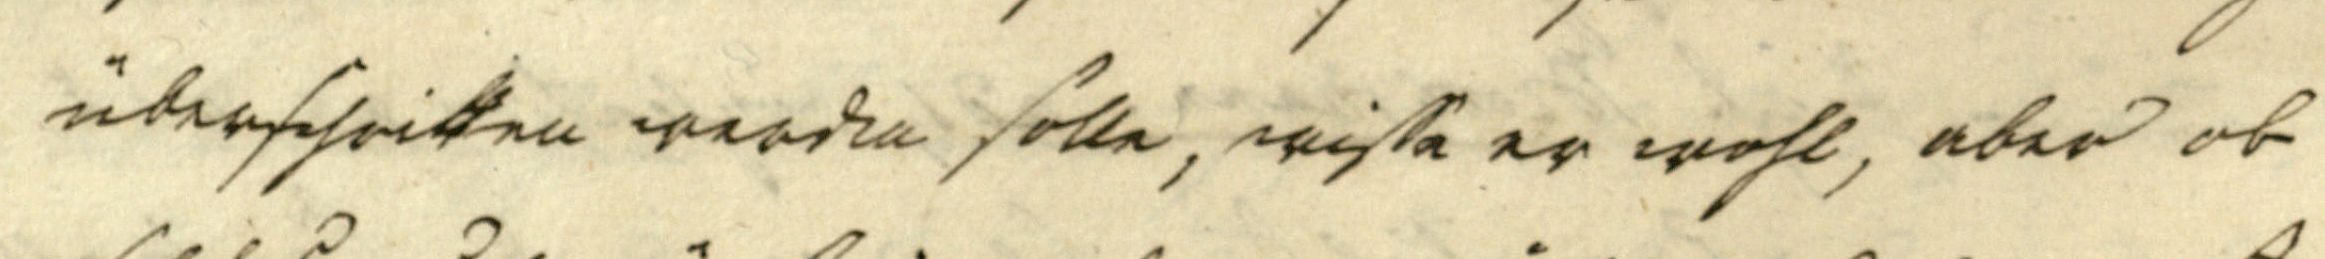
überschritten werden solle, wisse er wohl, aber ob
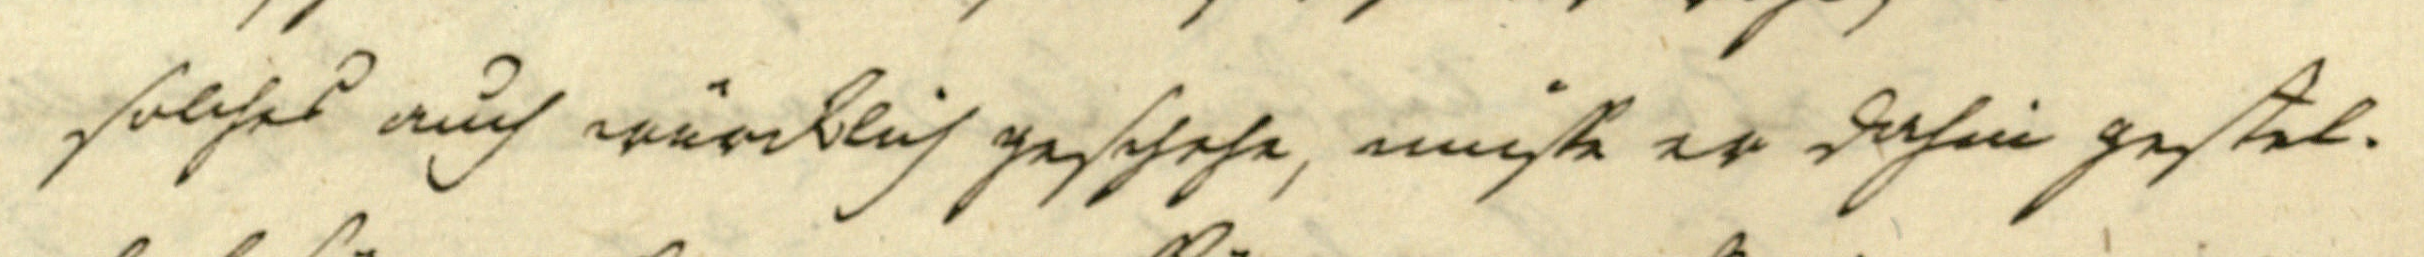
solches auch würcklich geschehe, müsse er dahin gestel¬
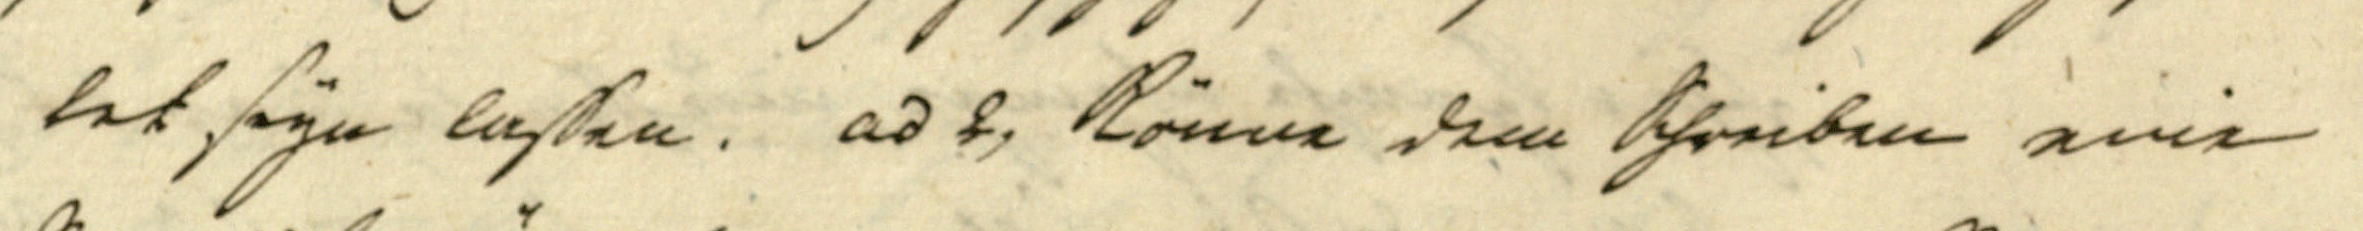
let seÿn lassen. ad 2. Könne dem Schreiben eine
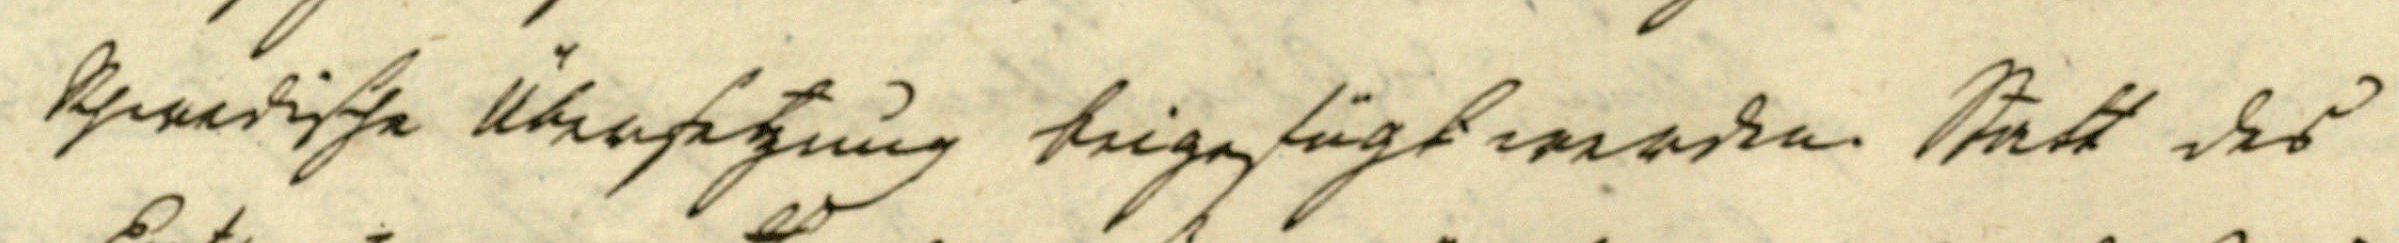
Schwedische Übersetzung beigefügt werden. Statt des
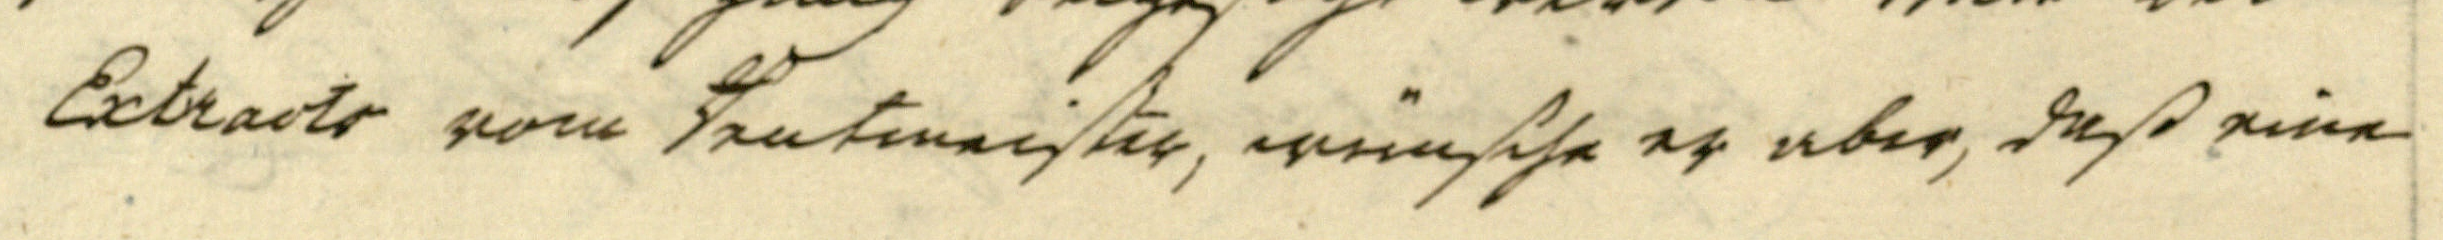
Extracts vom Rentmeister, wünsche er aber, daß eine
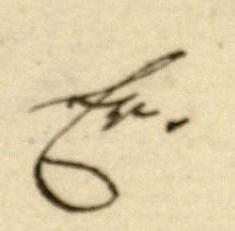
Er
